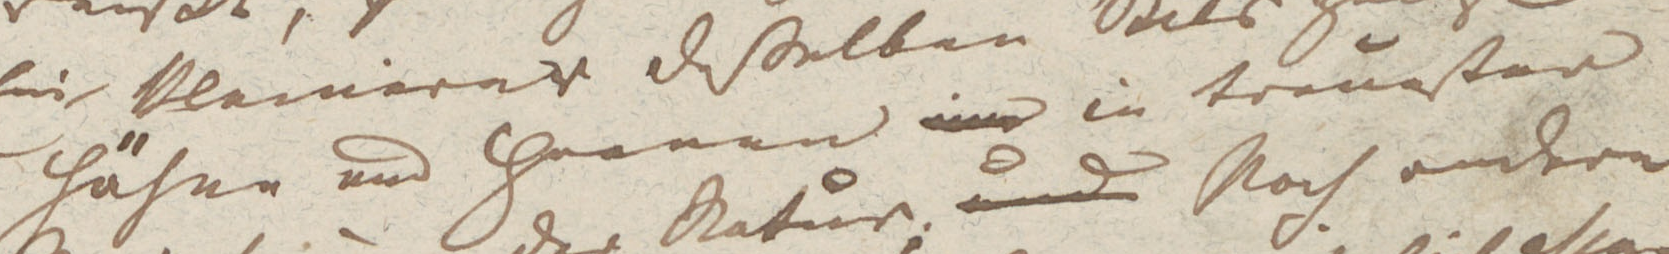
Hähne und Hennen im in treuester
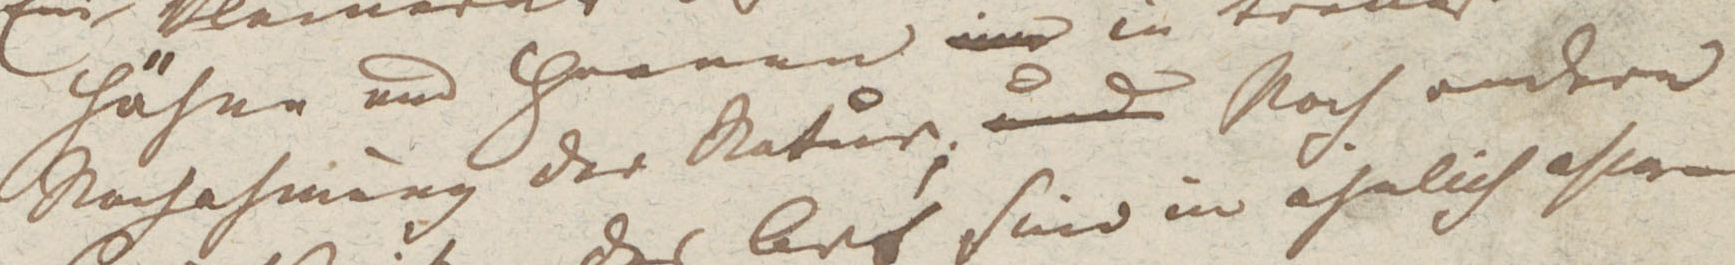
Nachahmung der Natur; und Noch andere
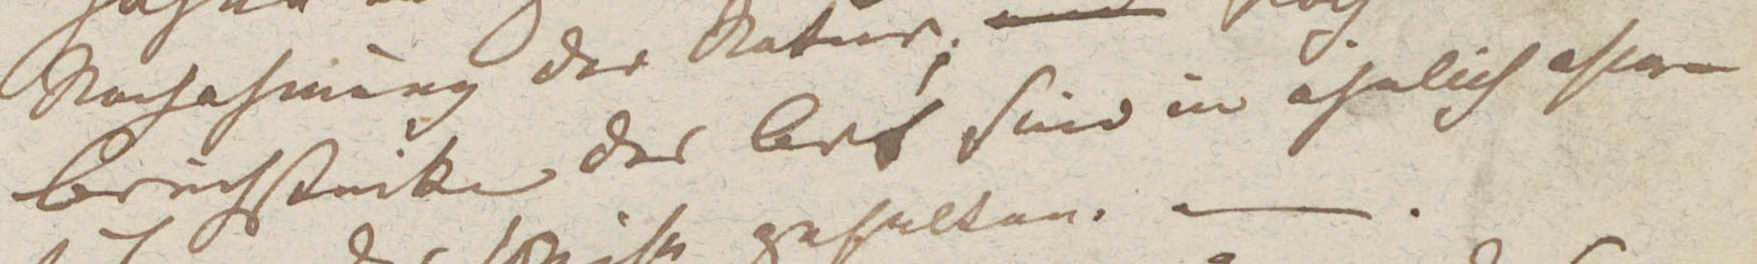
Bruchstücke der Art sind in ähnlich asia-
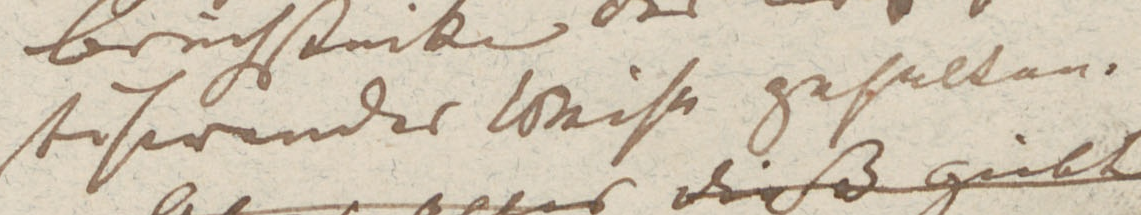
tisierender Weise gehalten. –
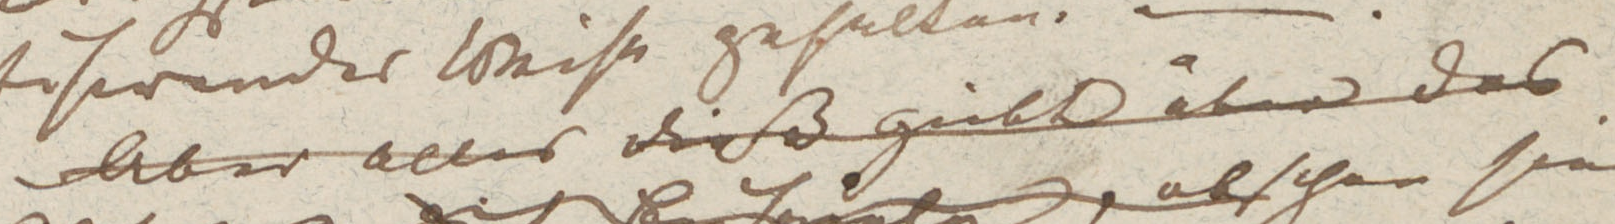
Aber alles diess giebt über das
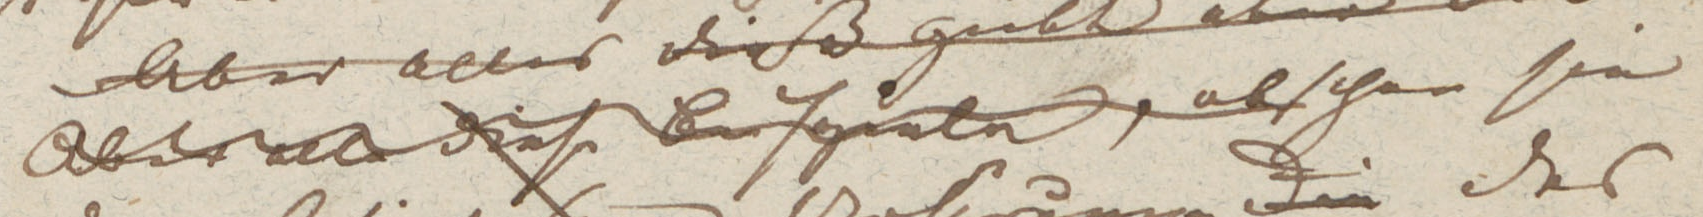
Aber alle diese Beispiele, obschon sie
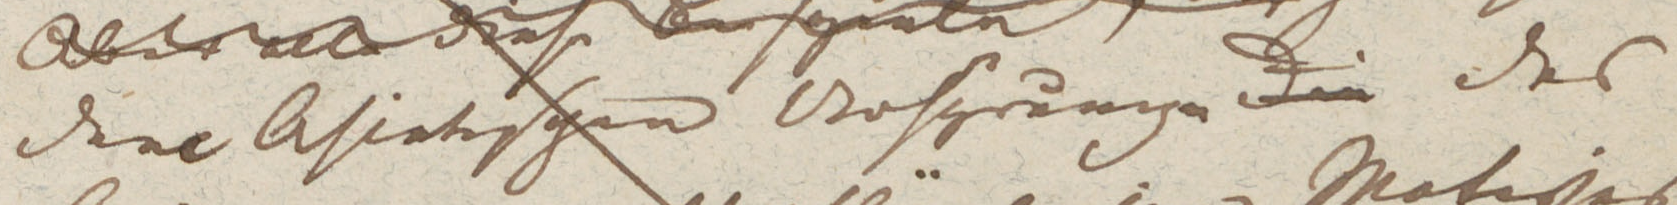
denm Asiatischen Ursprunge die des
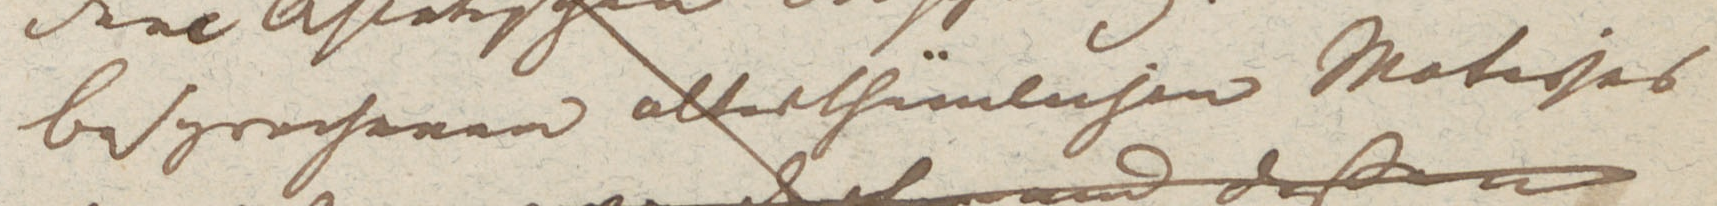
besprochenen alterthümlichen Motives
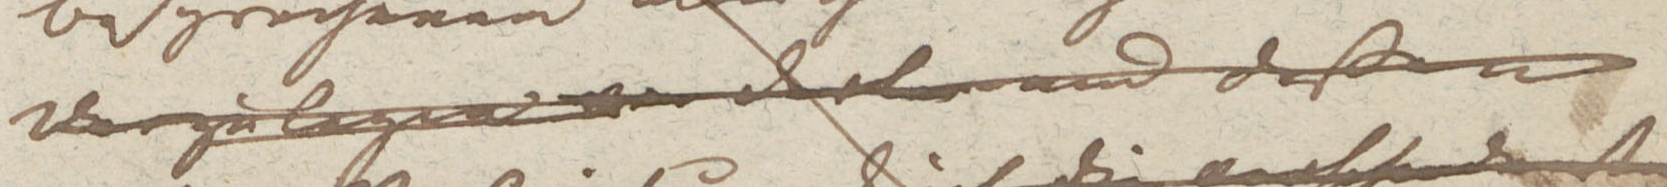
dar zu legen ver darl und dessen
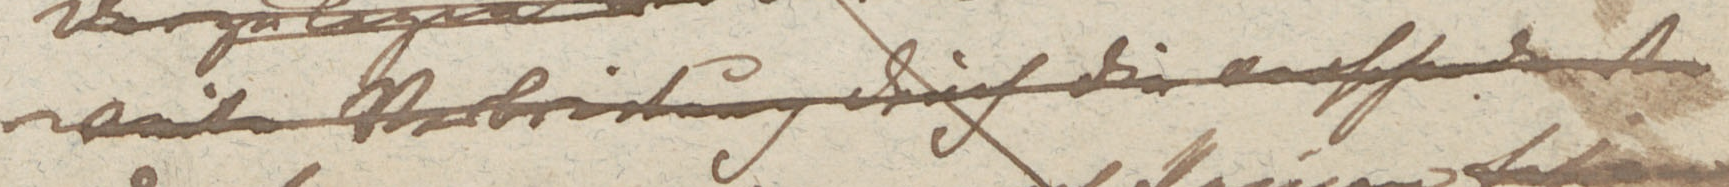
weite Verbreitung durch die verschiedenste
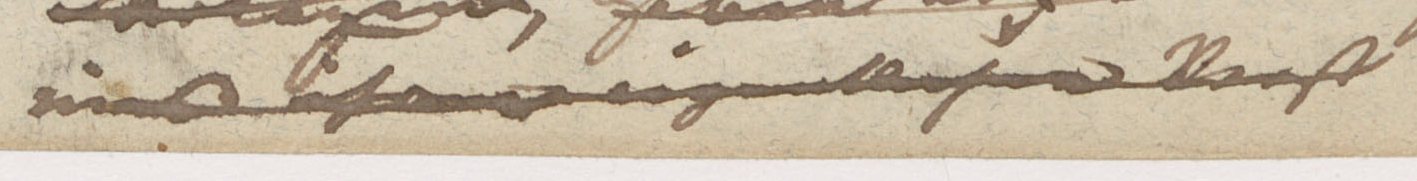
uns ihren eigentlichen Verst
